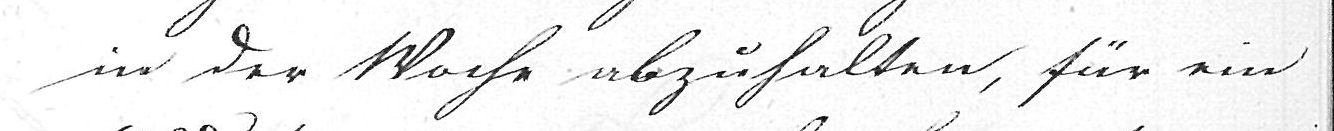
in der Woche abzuhalten, für ein
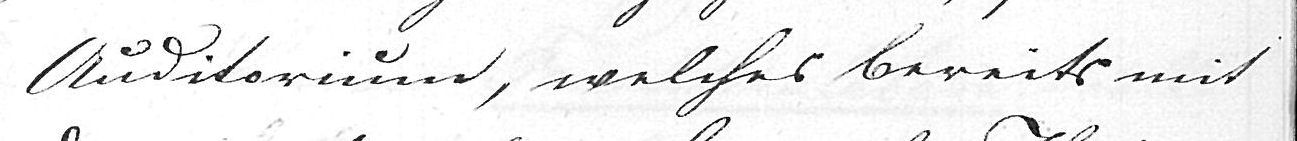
Auditorium, welches bereits mit
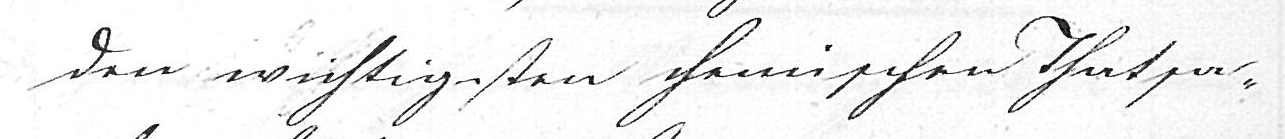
den wichtigsten chemischen Thatsa-
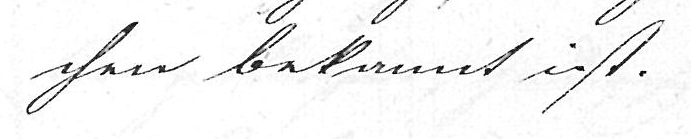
chen bekannt ist.
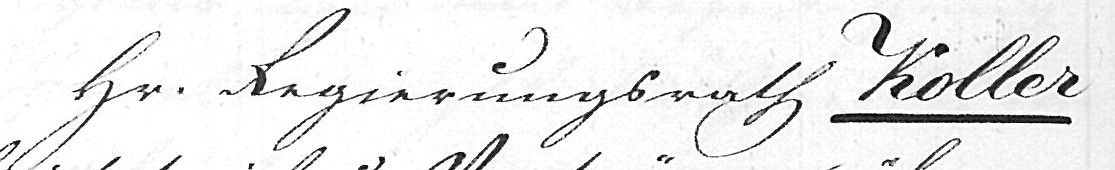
Hr. Regierungsrath Koller
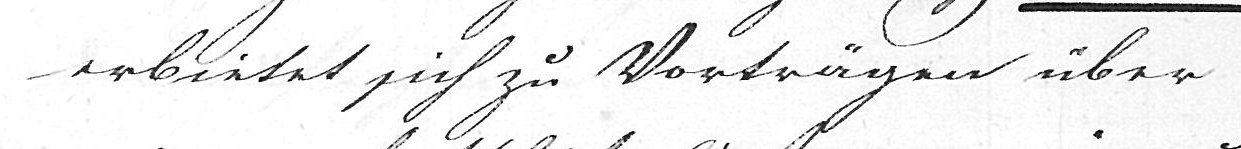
erbietet sich zu Vorträgen über
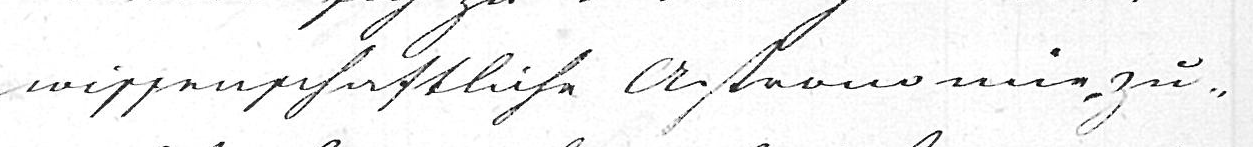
wissenschaftliche Astronomie zu-
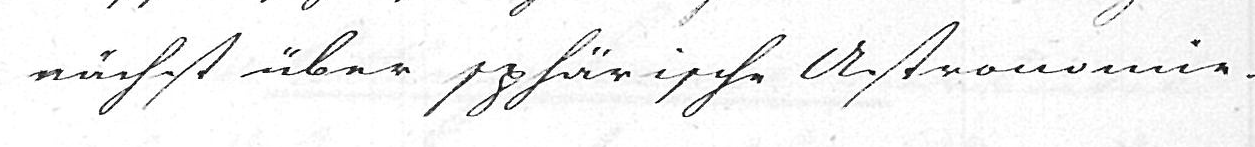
nächst über sphärische Astronomie.
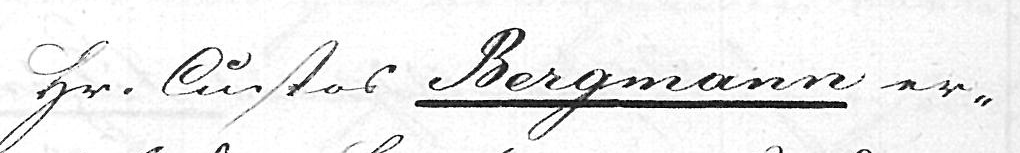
Hr. Custos Bergmann er-
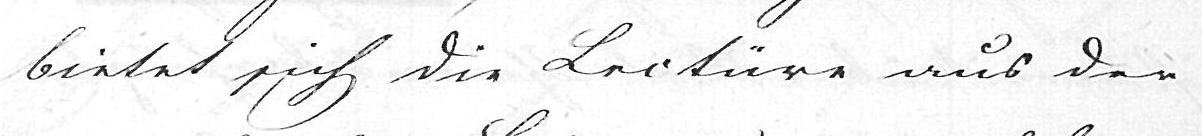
bietet sich die Lectüre aus der
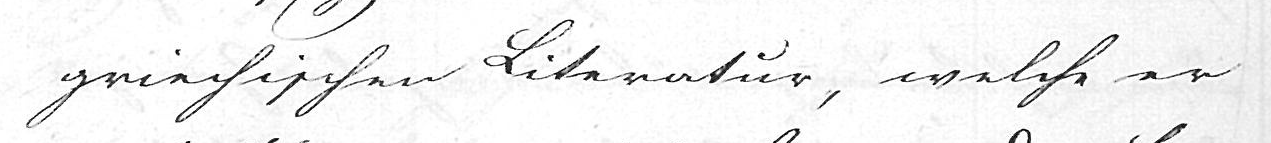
griechischen Literatur, welche er
